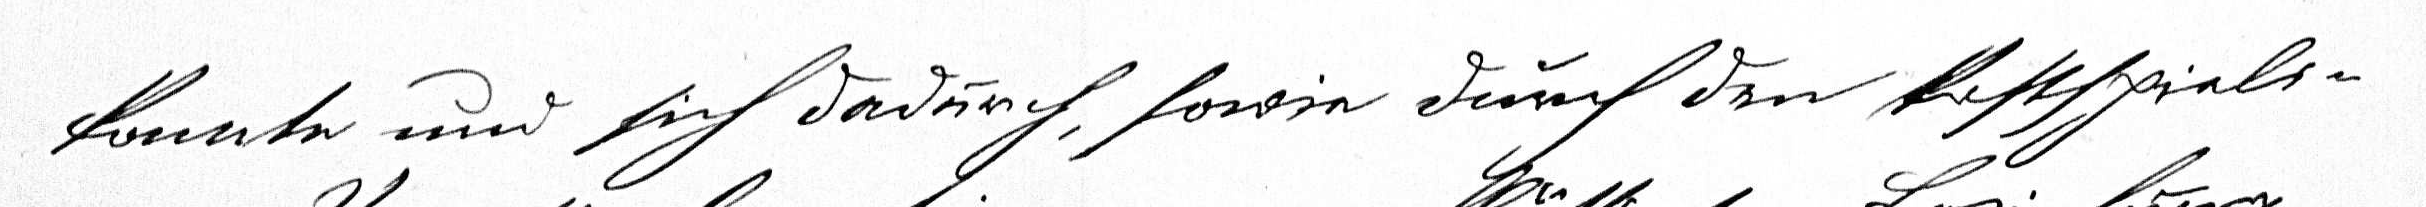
konnte und sich dadurch, sowie durch den kostspieli¬
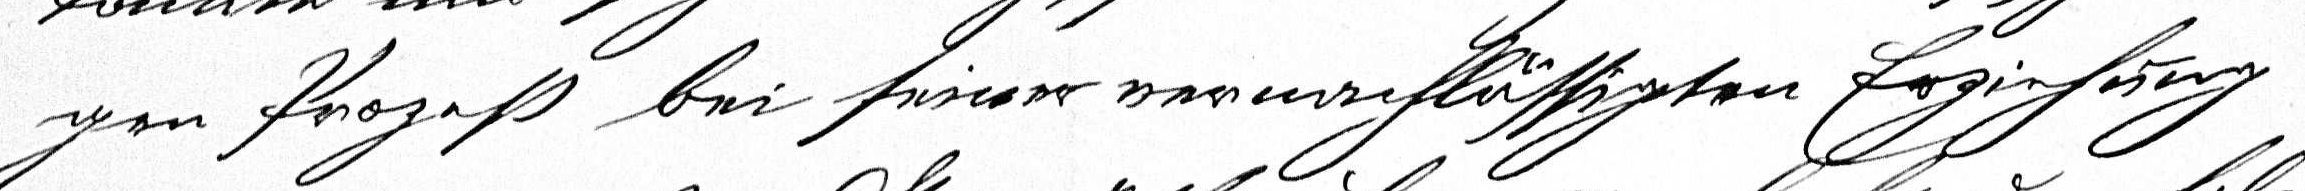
gen Prozeß bei seiner vernachlässigten Erziehung
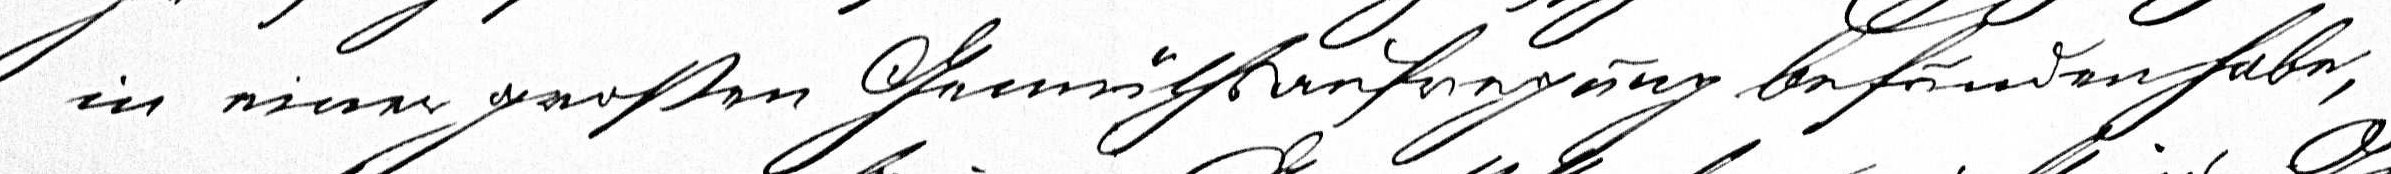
in einer großen Gemüthsaufregung befunden habe,
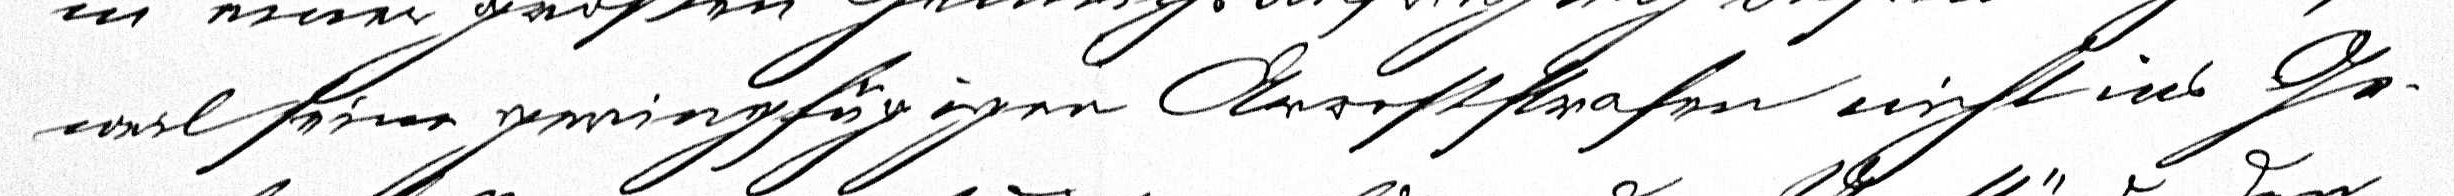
weil seine geringfügigen Arreststrafen nicht ins Ge¬
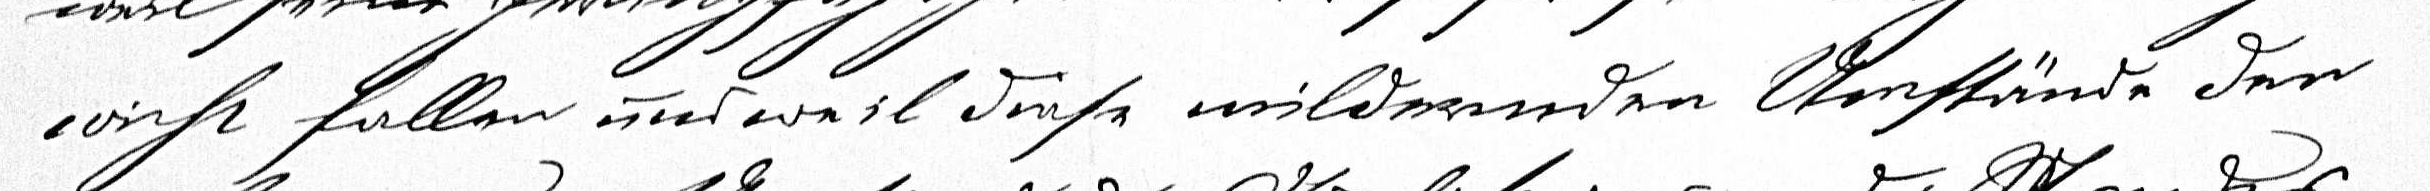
wicht fallen und weil diese mildernden Umstände den
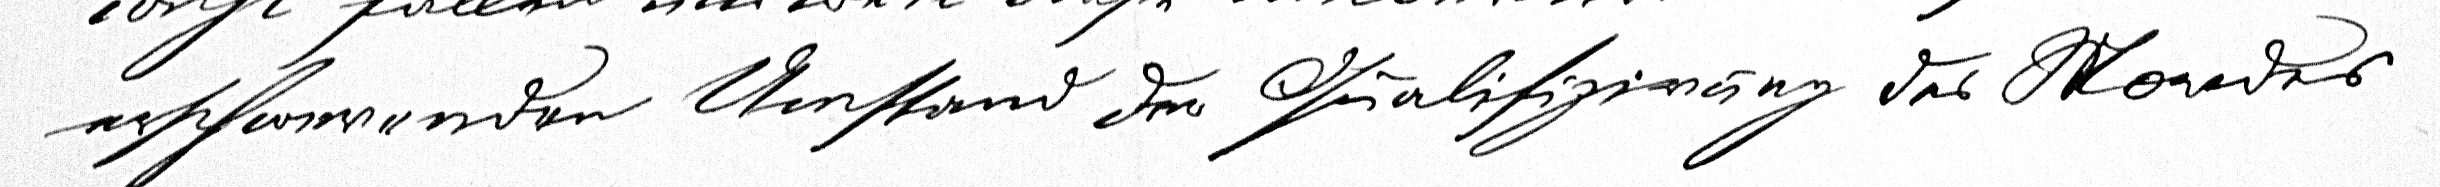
erschwerenden Umstand der Qualifizierung des Mordes
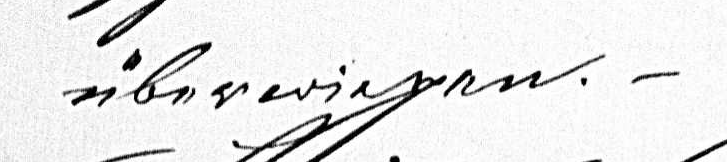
überwiegen.
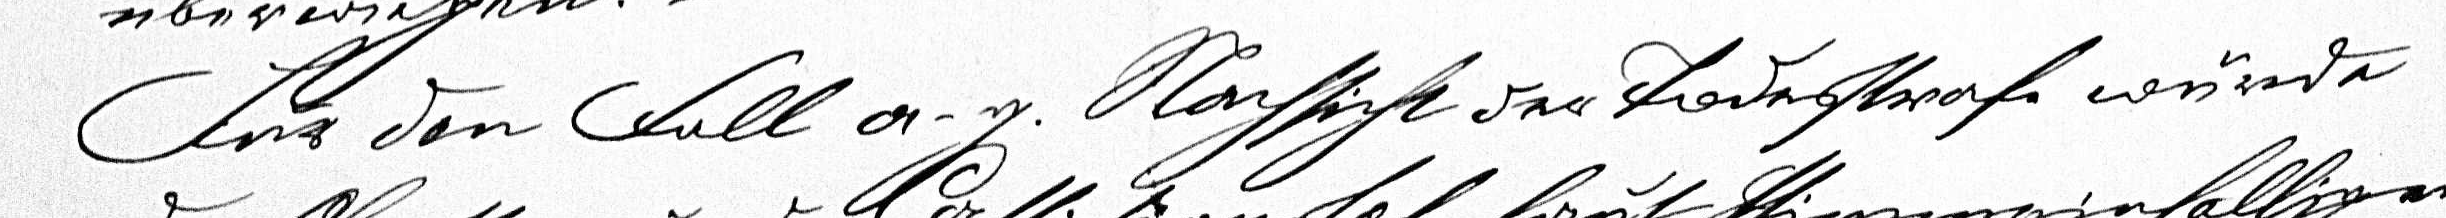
Für den Fall a.g. Nachsicht der Todesstrafe würde
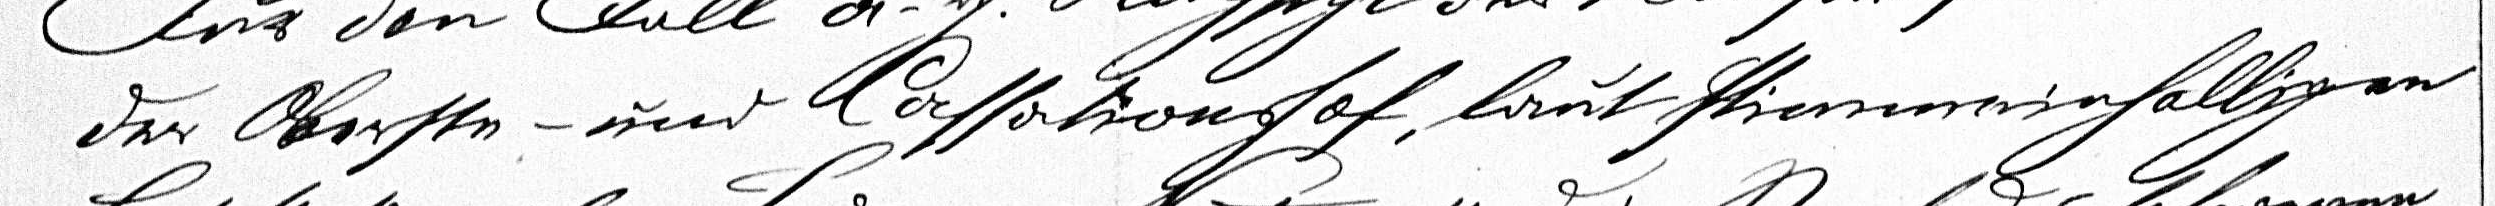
der Oberste- und Cassationshof, laut stimmeinhelligen
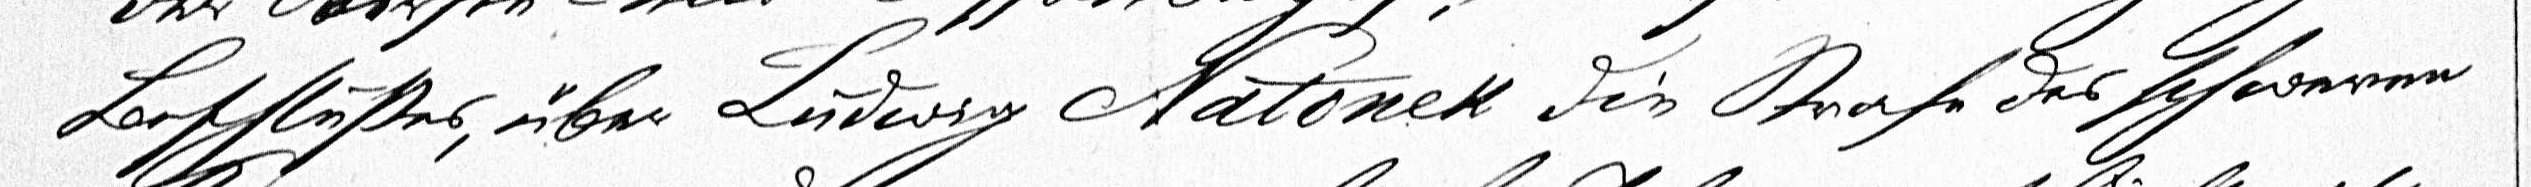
Beschlußes, über Ludwig Natonek die Strafe des schweren
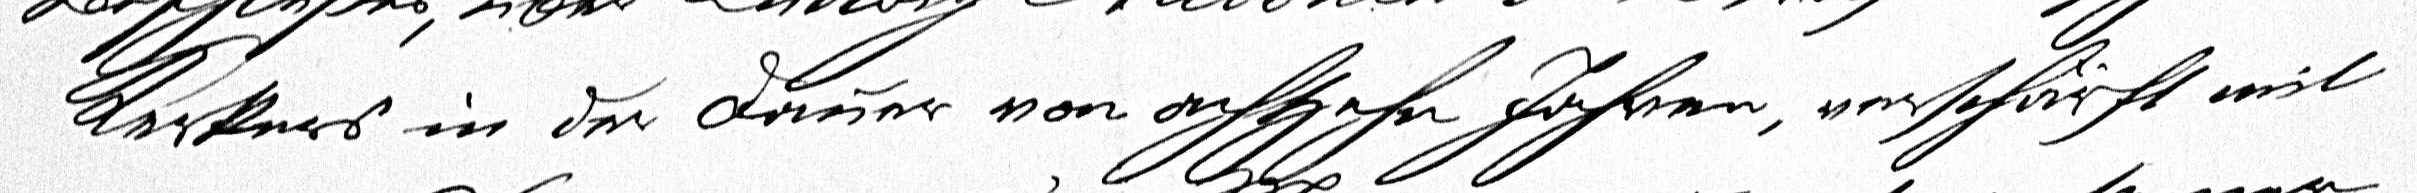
Kerkers in der Dauer von achtzehn Jahren, verschärft mit
